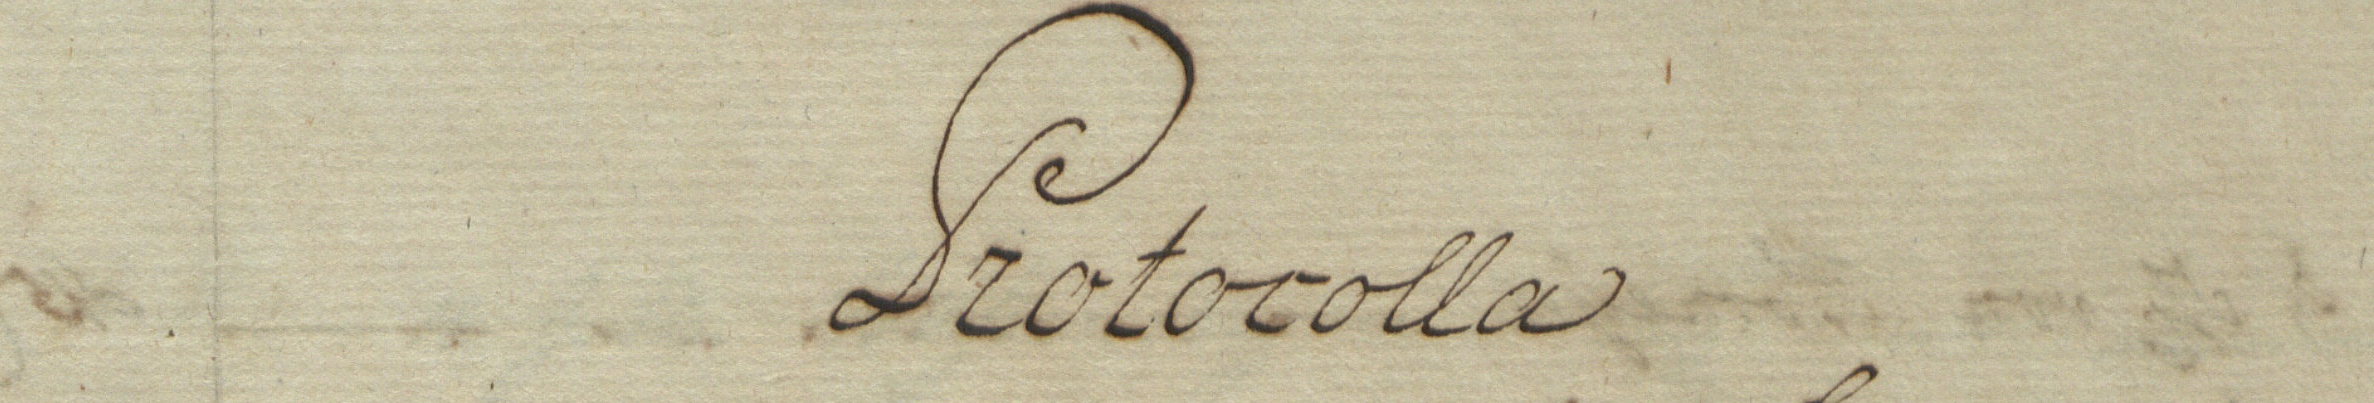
Protocolla
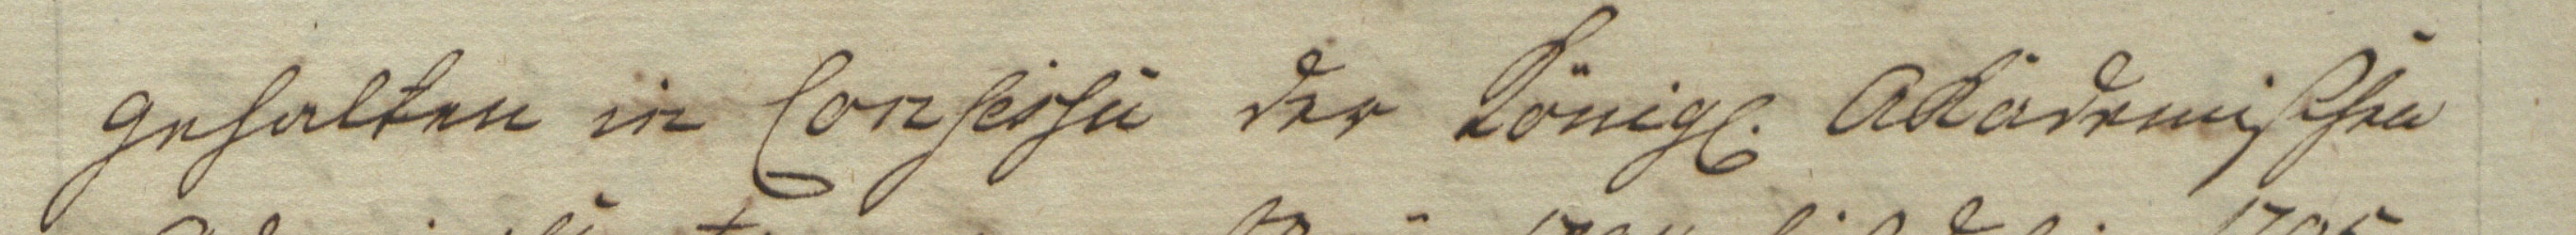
gehalten in Consessu der Königl. Akademischen
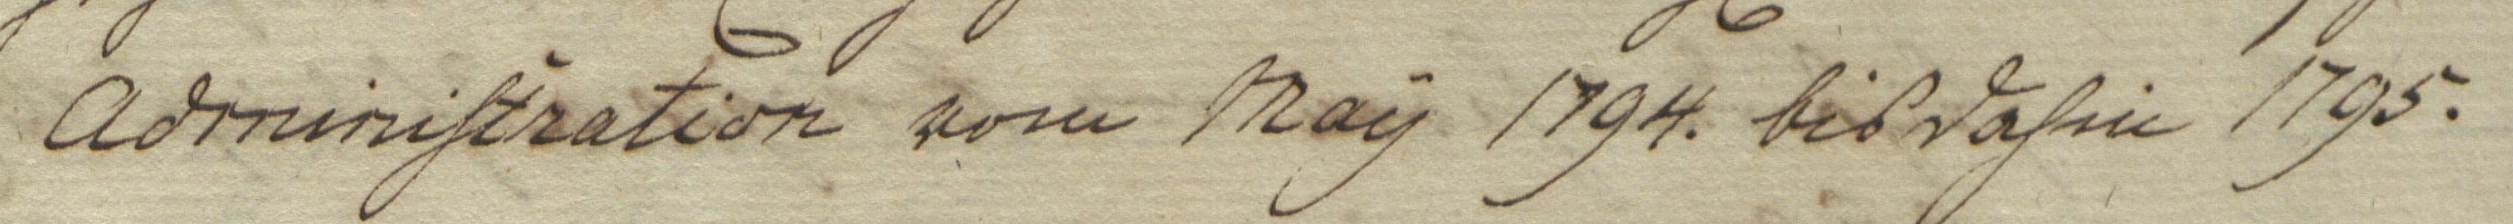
Administration vom May 1794. bis dahin 1795.
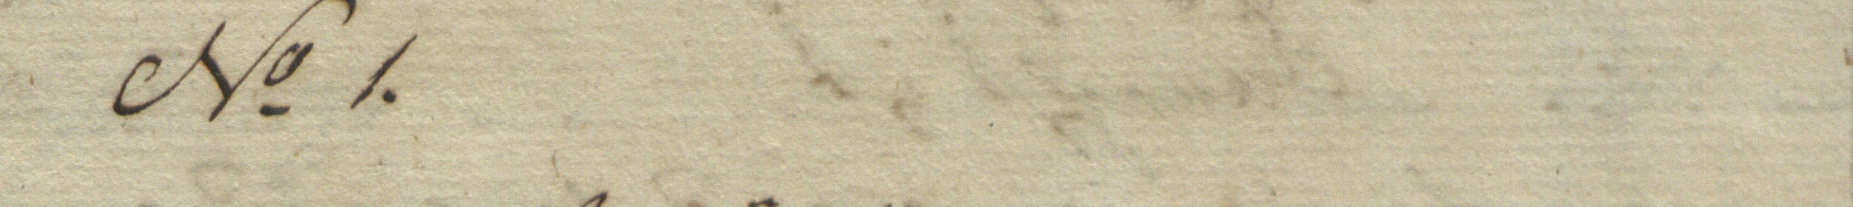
Nr. 1.
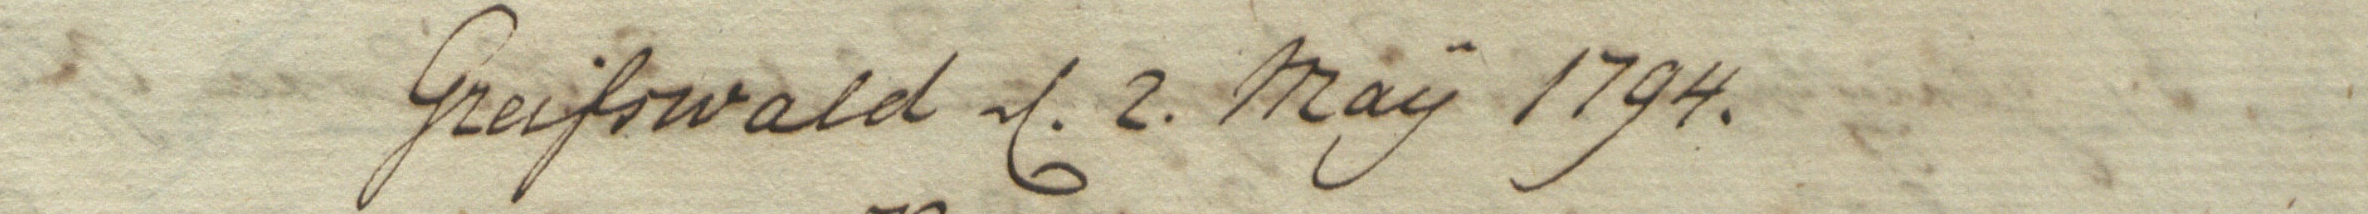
Greifswald d. 2. May 1794.
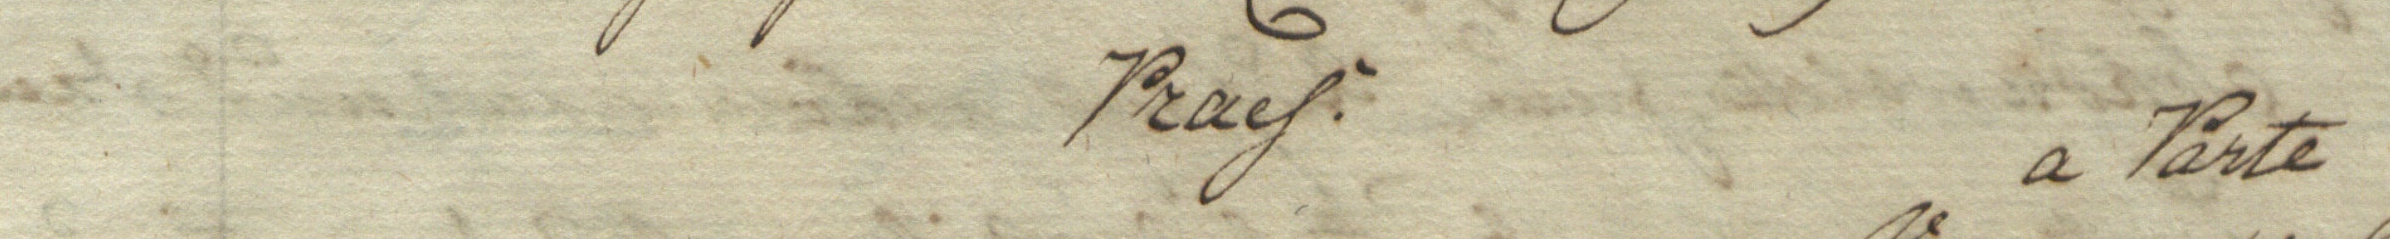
Praes. a Parte
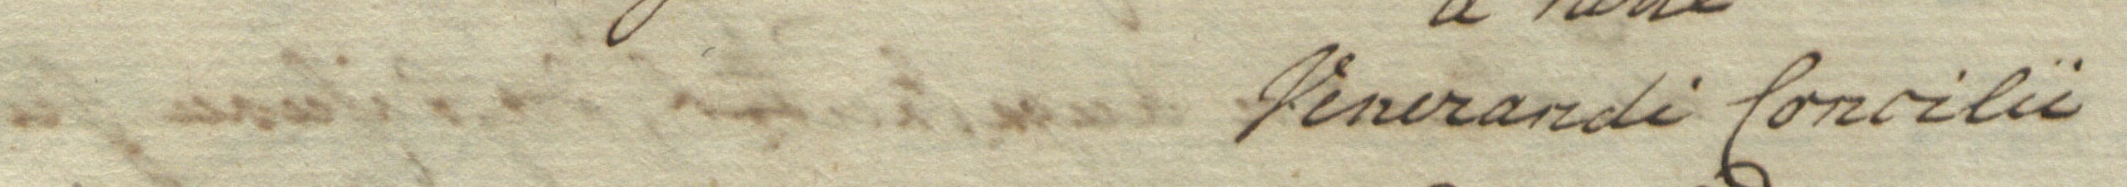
Venerandi Concilii
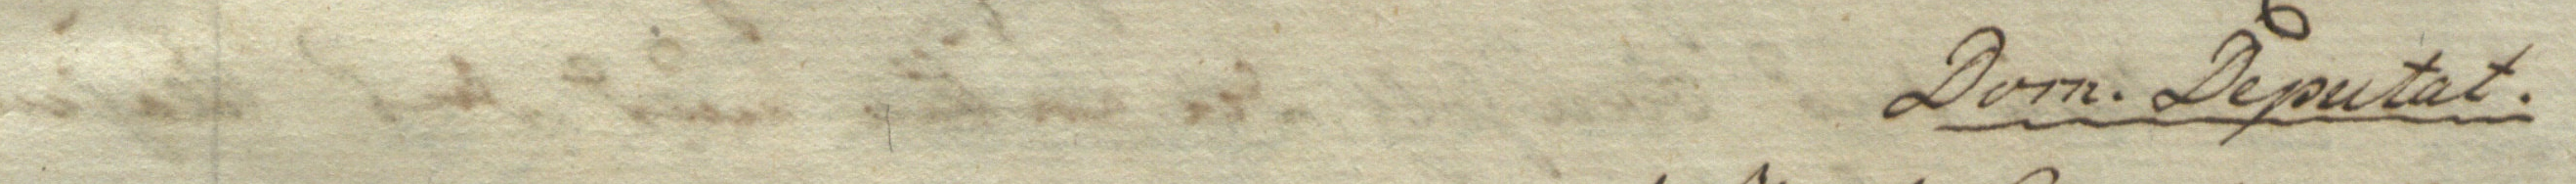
Dom. Deputat.
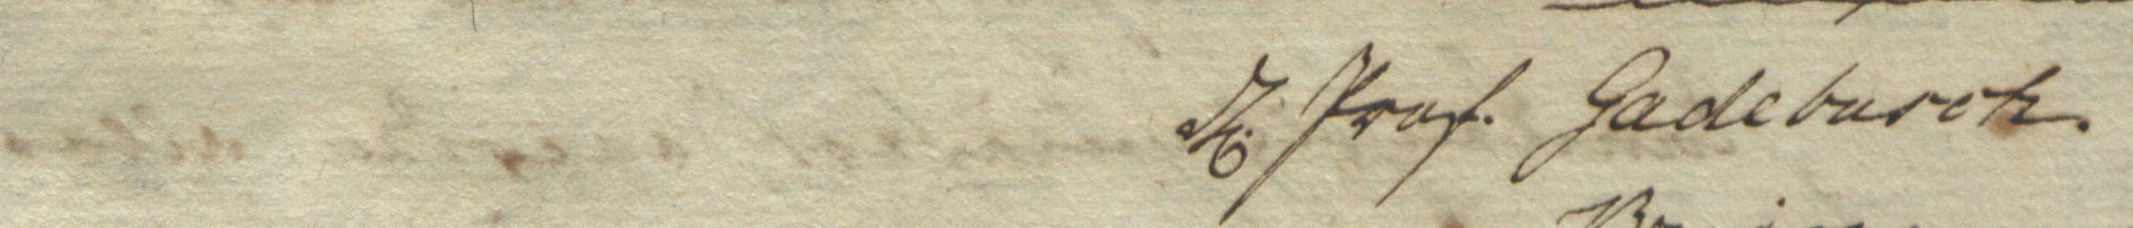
dh. Prof. Gadebusch.
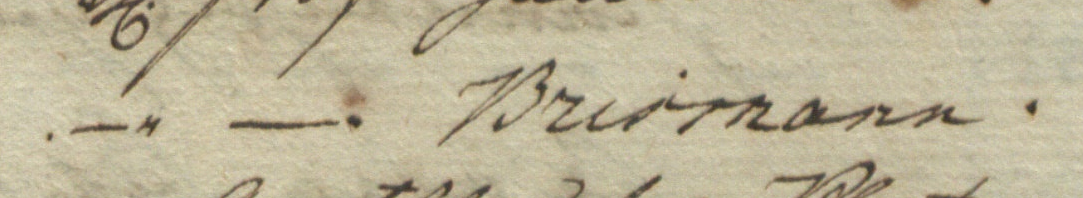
"-"-" Brismann.
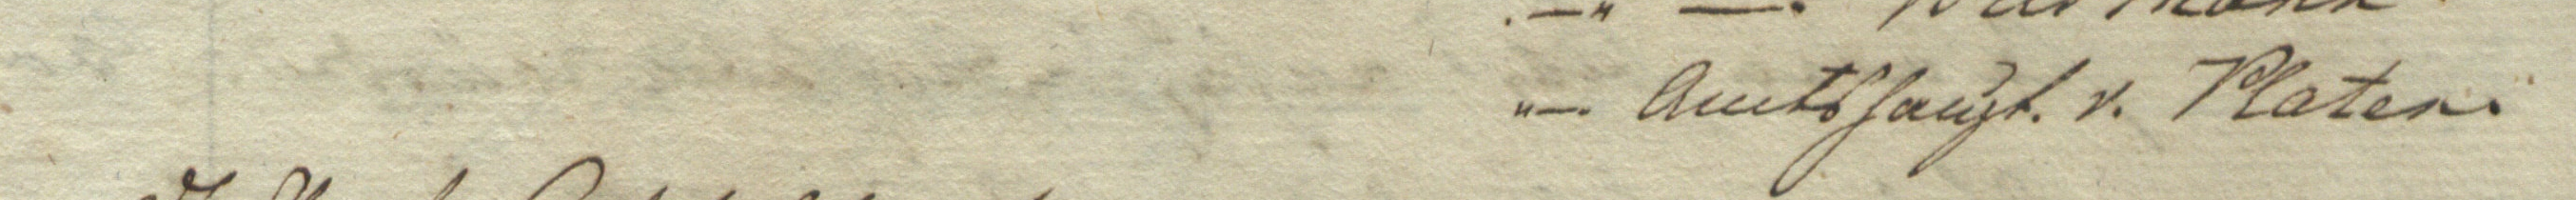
"-" Amtshaupt. v. Platen.
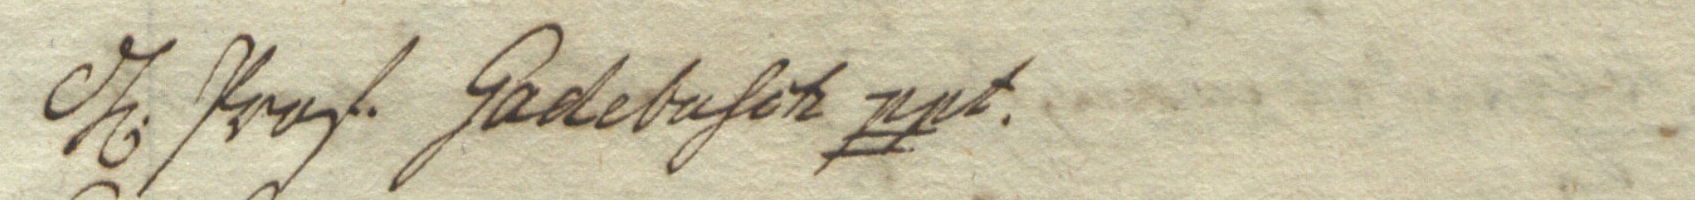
dh. Prof. Gadebusch ppt.
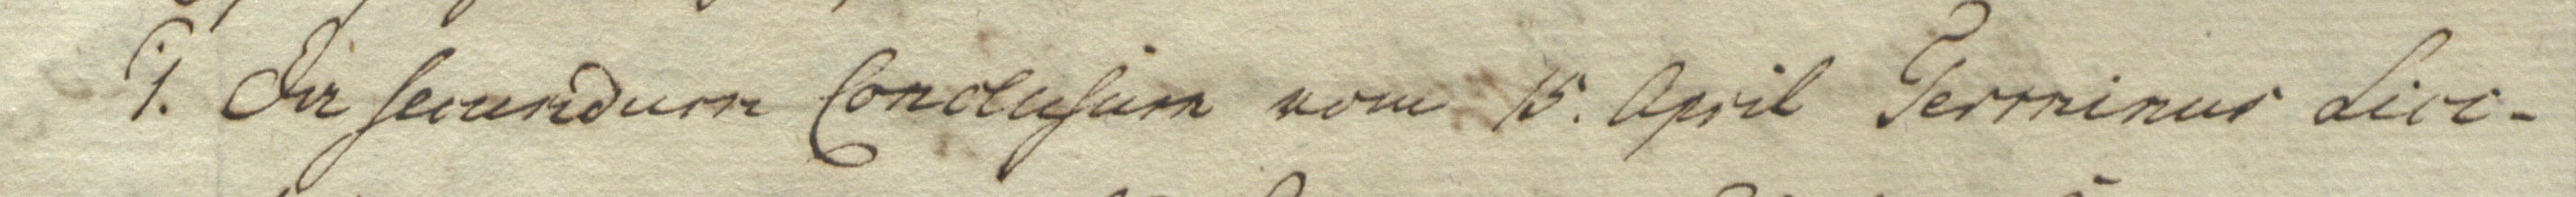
1. Da secundum Conclusum vom 15. April Terminus Lici¬
